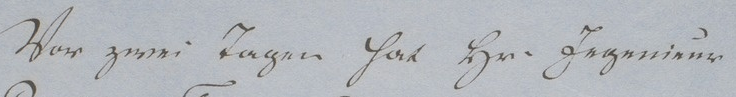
Vor zwei Tagen hat Hr. Ingenieur
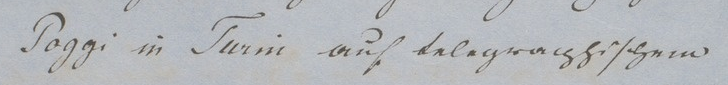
Poggi in Turin auf telegraphischem
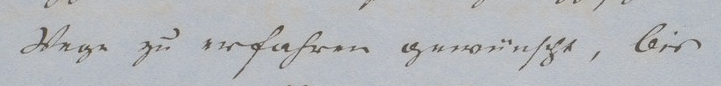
Wege zu erfahren gewünscht, bis
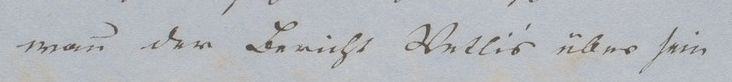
wann der Bericht Wetli's über sein
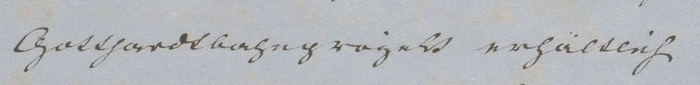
Gotthardtbahnprojekt erhältlich
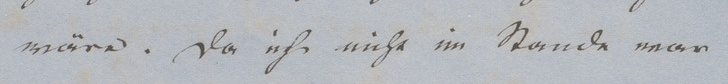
wäre. Da ich nicht im Stande war
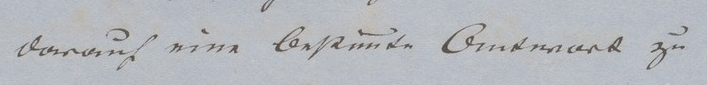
darauf eine bestimmte Antwort zu
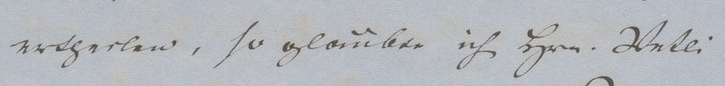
ertheilen, so glaubte ich Hrn. Wetli
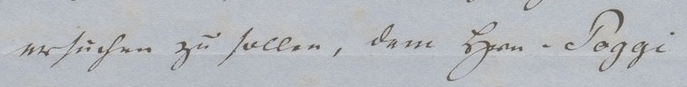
ersuchen zu sollen, dem Hrn. Poggi
